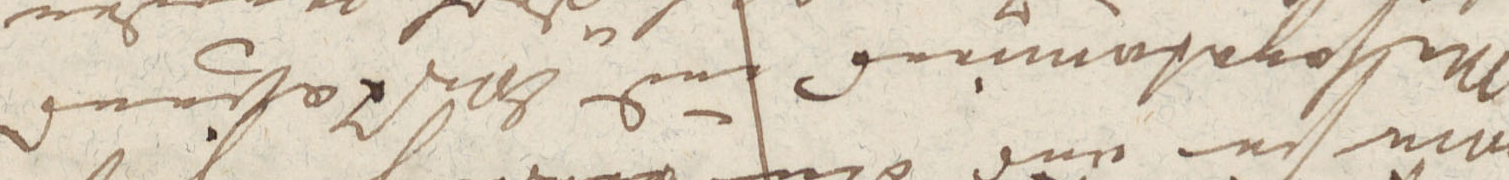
entgegengesetzten Beobachtungspunkte
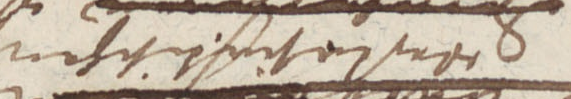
weniger gegründet oder hervorge
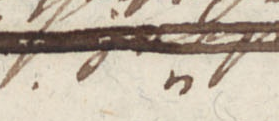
natürlicheren
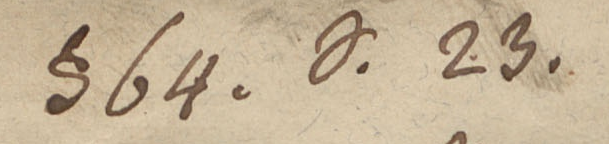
§ 64. S. 23.
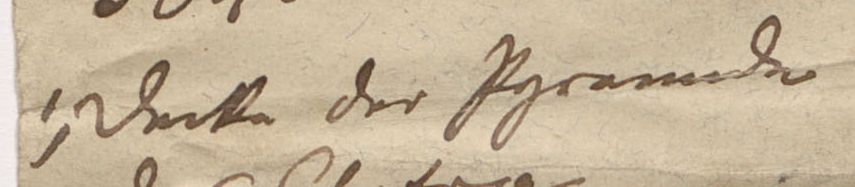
Decke der Pyramide
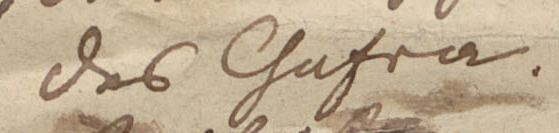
des Chafra.
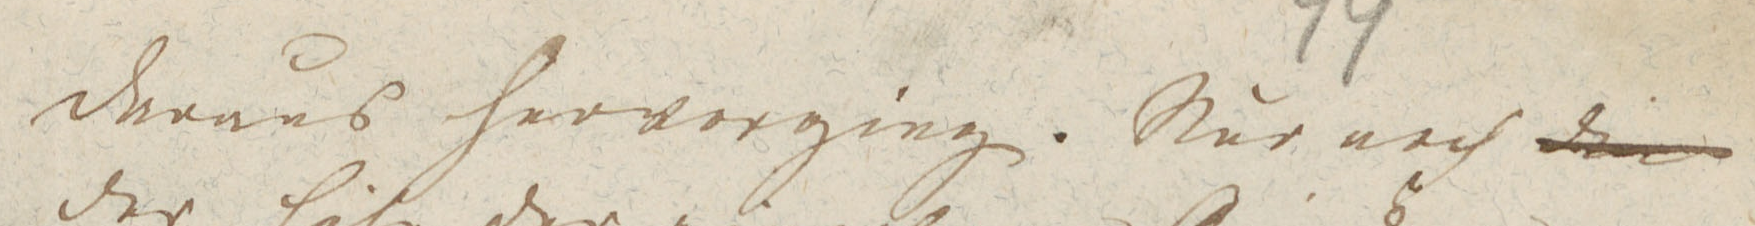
daraus hervorging. Nur noch die
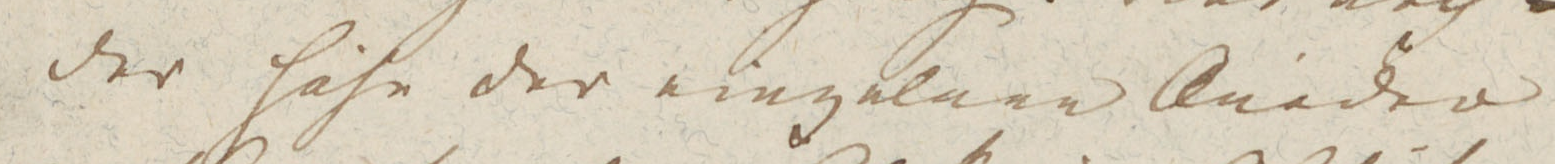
der Höhe der einzelnen Quader
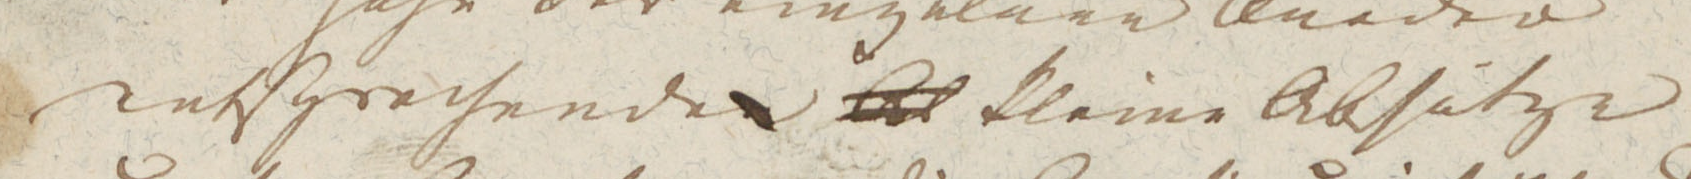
entsprechenden Ab kleine Absätze
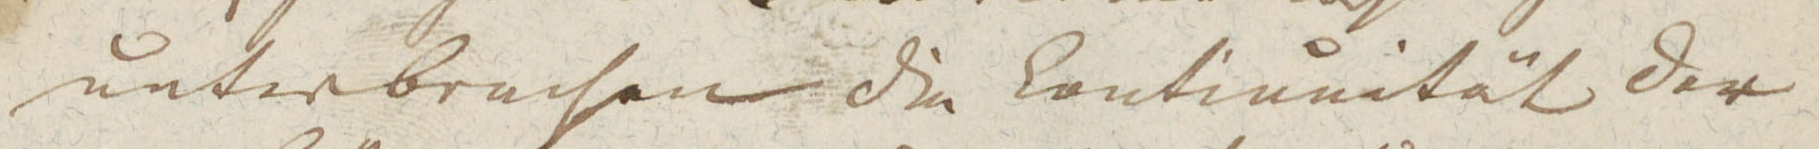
unterbrachen die Continuität der
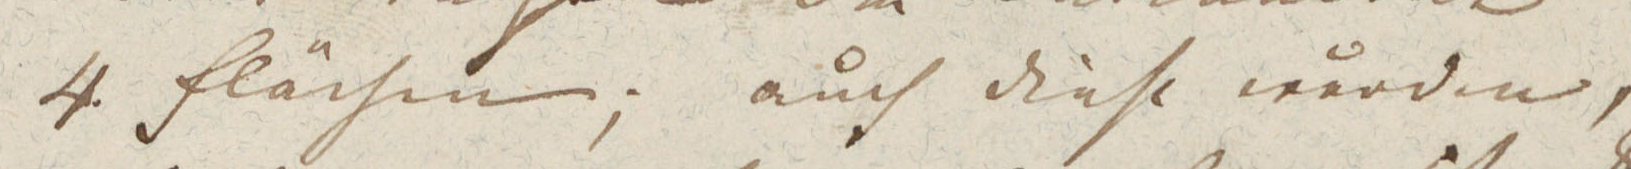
4 Flächen; auch diese wurden,
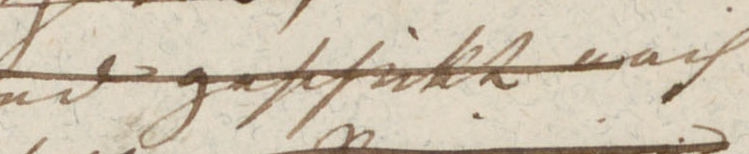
und geschickt nach
